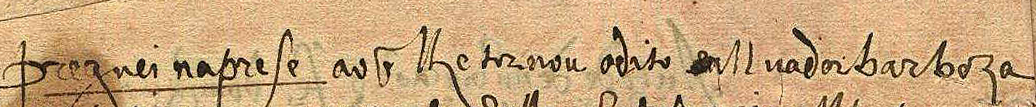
preguei na prese ao q̄ lhe tornou o dito salluador barboza
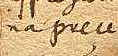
na prece
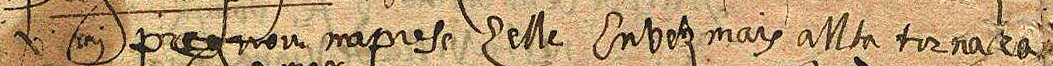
v. m. preguou na prese E elle En voz mais allta tornara
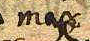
mar
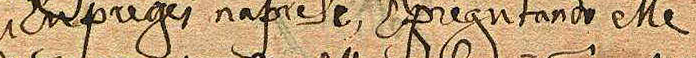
Eu pregei na prese, E pregūtando elle
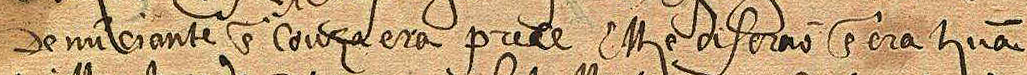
denūciante q̄ couza era prece E lhe diserão q̄ era huā
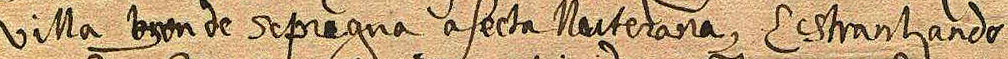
villa honde se pregua a secta lluterana, E estranhando
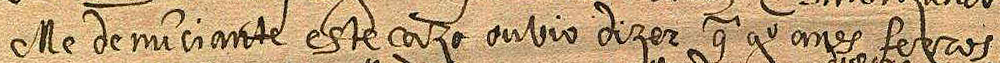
elle denūciante este cazo ouvio dizer q̄ go anes ferros
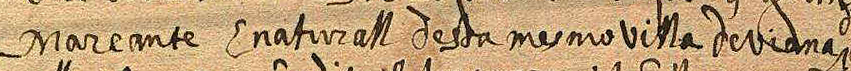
Mareante E naturall desta mesma villa de viana,
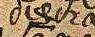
disera
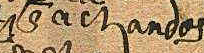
q̄ achandos
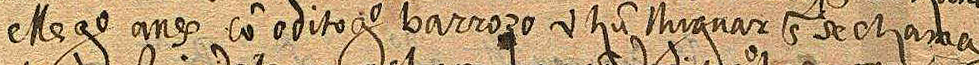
elle go anes cō o dito go barrozo ē hū lluguar q̄ se chama
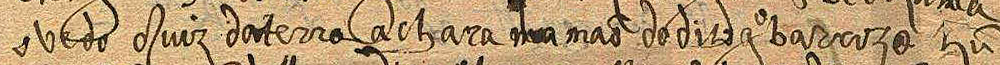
ovedo o Juiz da terra achara na maõ do dito go barrozo hū
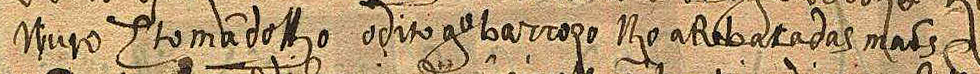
lliuro E tomādo lho o dito go barrozo lho aRebata das maõs e
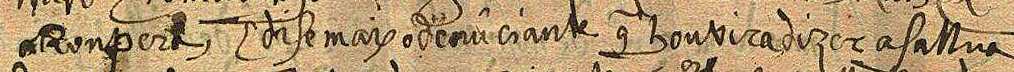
o Ronpera, E dise mais o denūciante q̄ houvira dizer a sallua
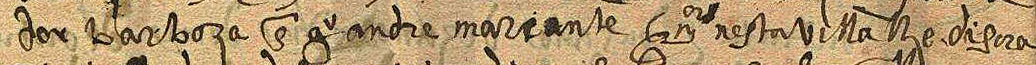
dor barboza q̄ go andre mareante E mor nesta villa lhe disera
